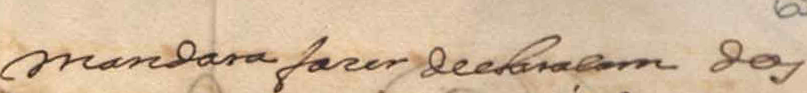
mandara fazer declaraçam dos
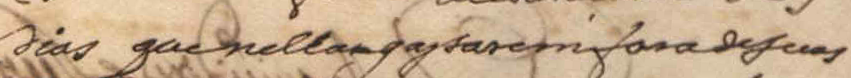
dias que nellas gastarem fora de suas
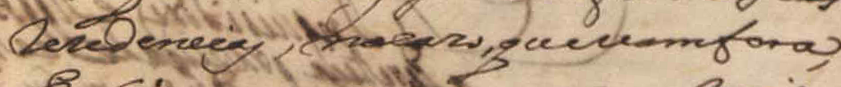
Rezedencias, no cazo, que vam fora,
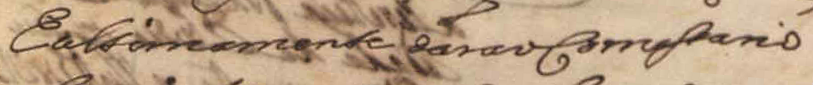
E ultimamente dar ao Comessario
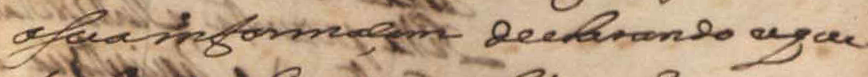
a sua informaçam declarando o que
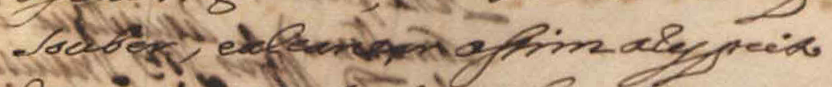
souber, e alcançar assim a Respeito
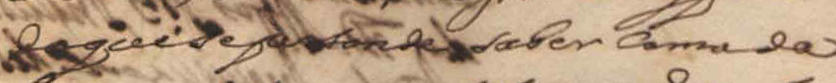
do que se pertende saber com a da
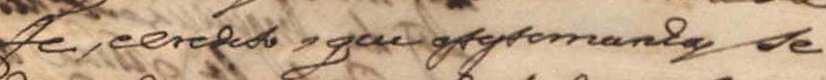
fe, e credito, que as testemunhas se
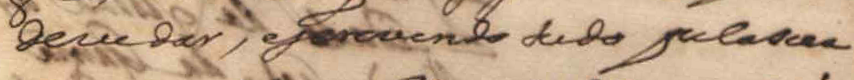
deve dar, escrevendo tudo pela sua
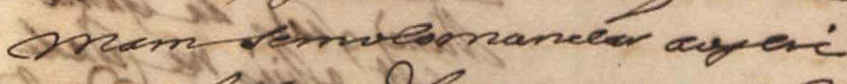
mam sem o comonicar ao scri
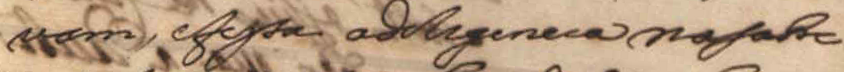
vam, e feyta a diligencia na sobre
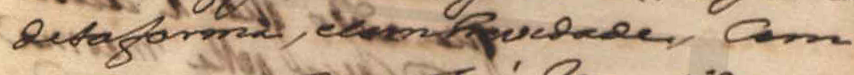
dita forma, e com brevedade, com
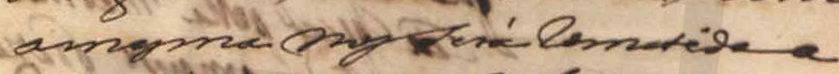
a mesma nos será Remetida a
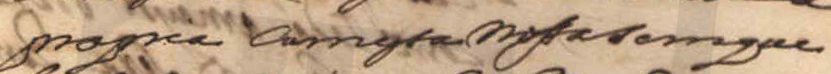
propria com esta nossa sem que
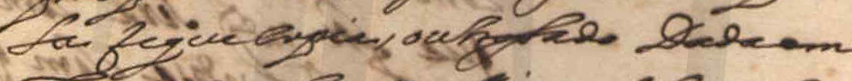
la fique copia, ou treslado Dada em
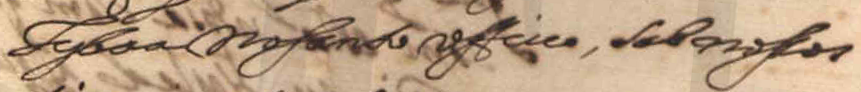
Lisboa no santo officio, sob nossos
